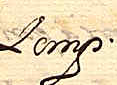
Temp.
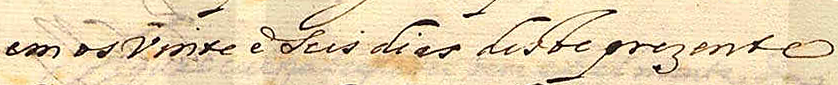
em os vinte e seis dias deste prezente
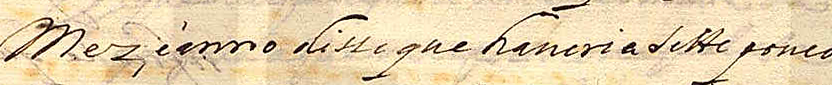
Meza, e anno disse que haueria sette pouco
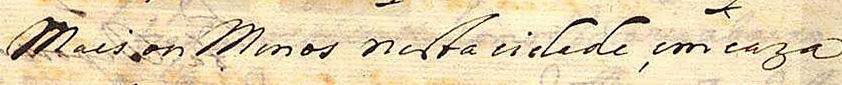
Mais ou Menos nesta cidade, em caza
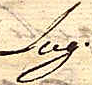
Lug.
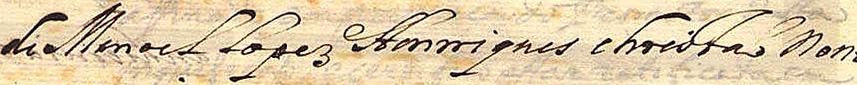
de Manoel lopes Henrriques christão nouo
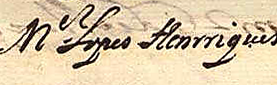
M.el Lopes Henrriques
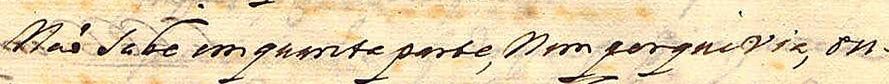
Naõ sabe em quanta parte, Nem por que via, ou
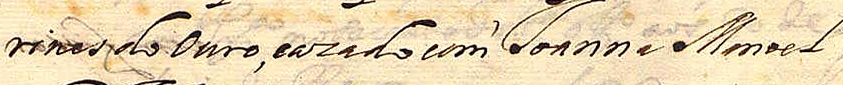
riues do Ouro, cazado com Ioanna Manoel
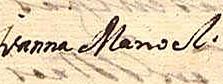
Joanna Manoel.
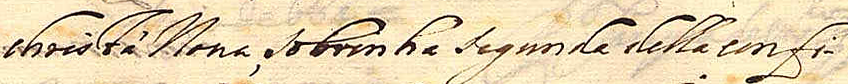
christā Noua, sobrinha segunda della confi
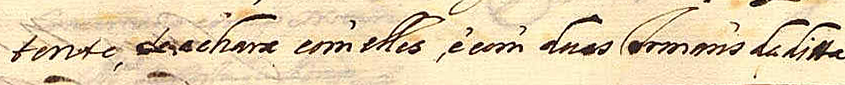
tente, se achara com elles, e com duas Irmans da ditta
